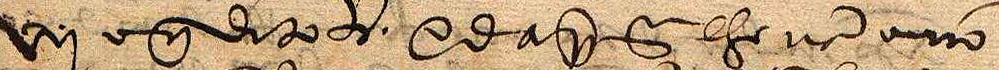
vez o q̄ dito tē. e da p̄ma lhe nā ouio
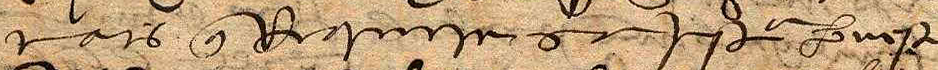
mais q̄ Requerer sa Justa honesta
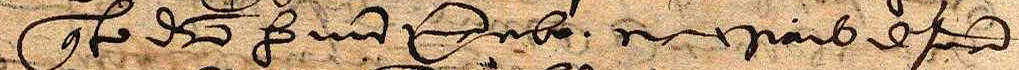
q̄ ho dt̄o homē mācebo era criado de Joā
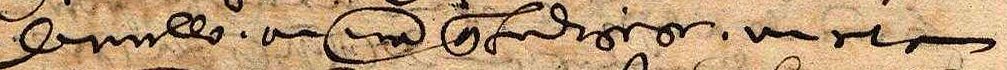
de mello. ou nā q̄ ho disese. ou era
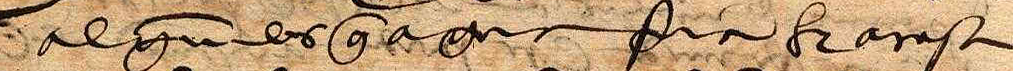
algū dos q̄ agora forā hy a casa
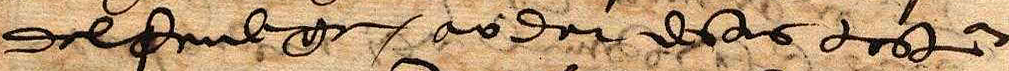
dalfandega / ao dar destes testos
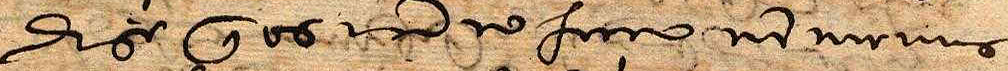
dise q̄ os nā conheceo nē menos
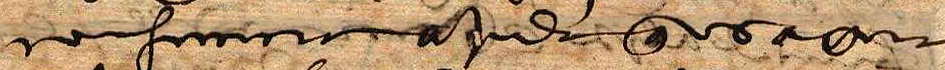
conheceria aJnda q̄ os agora
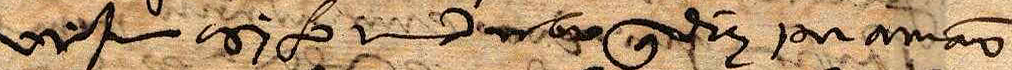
veJa asy ho mācebo q̄ diz por a mão
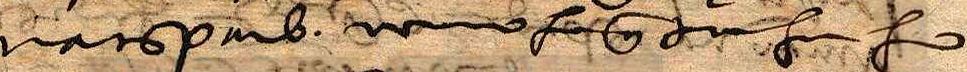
na espado. como ho q̄ tinha ho
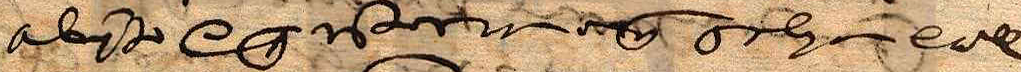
abyto e q̄ esto era o q̄ sabja e all
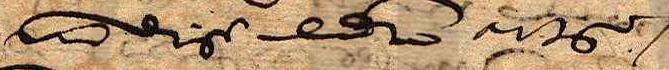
nō dise do dtō arto /
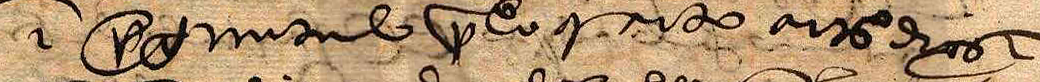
item p̄guntado p̄lo quarto arto disse
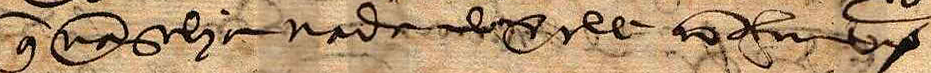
q̄ nā sabja nada do ē elle cōtheudo /
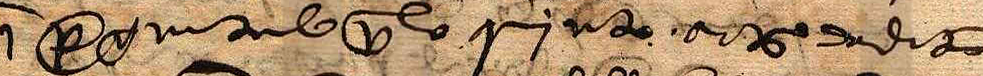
item p̄guntado p̄lo qujnto arto da dita
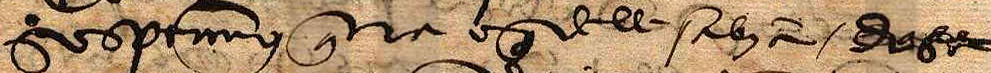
sospeição q̄ era o q̄ delle sabyā / dise
